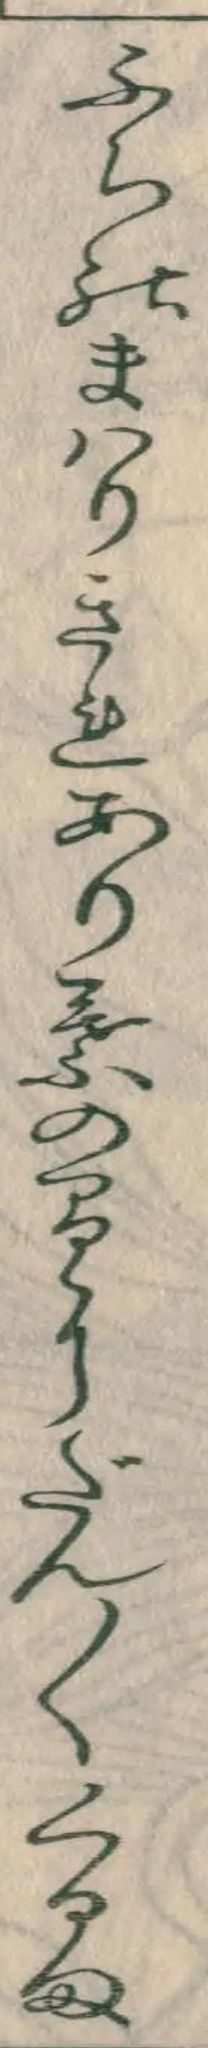ふちのまはりきれあり葉の間にだん〳〵くるま
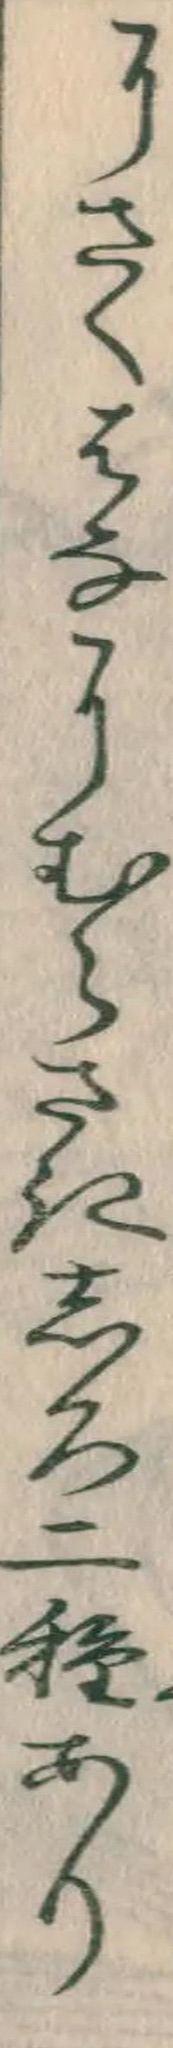にさくはなにむらさきしろ二種あり
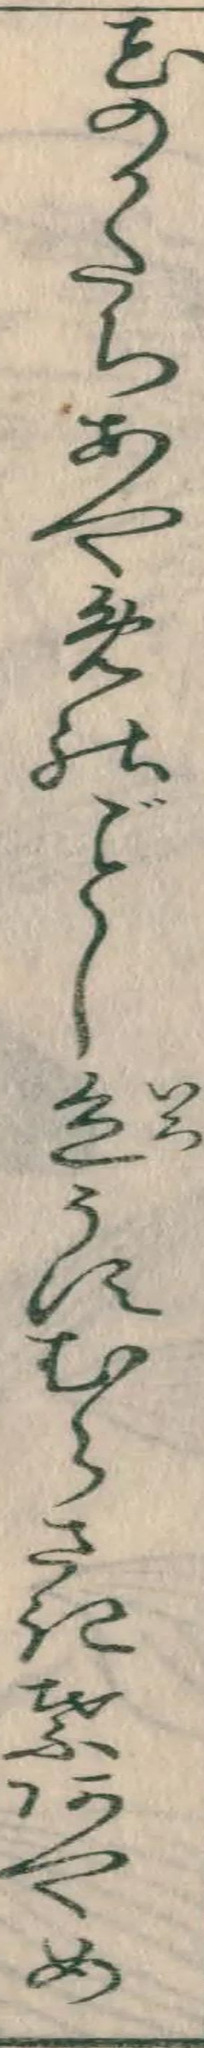花のかたちあやめのごとし色うすむらさき葉あやめ
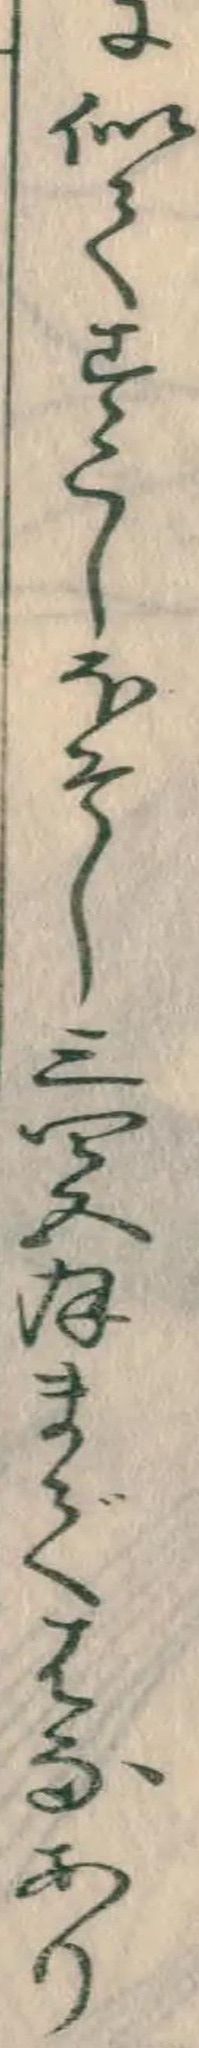に似てすこしほそし三四五月まではなあり
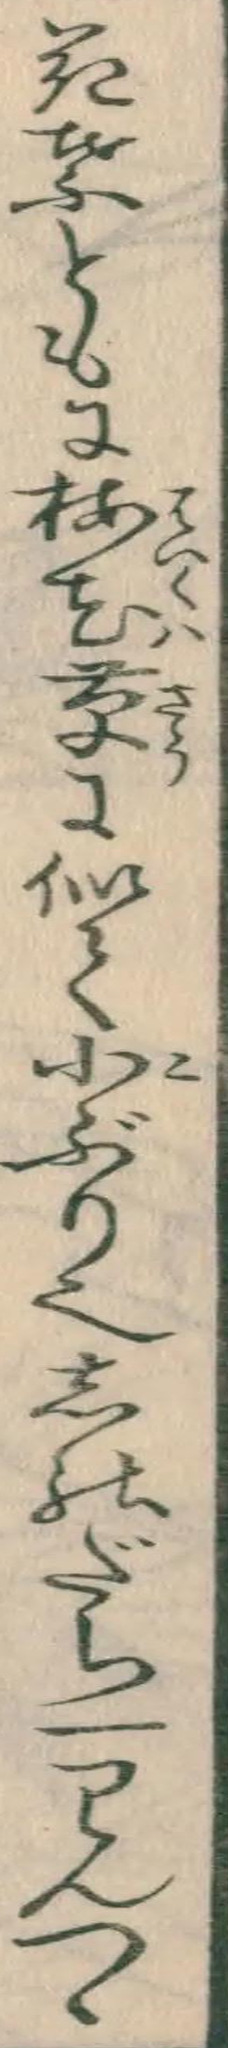花葉ともに梅花草に似て小ぶり也しのだち一りんつゝ
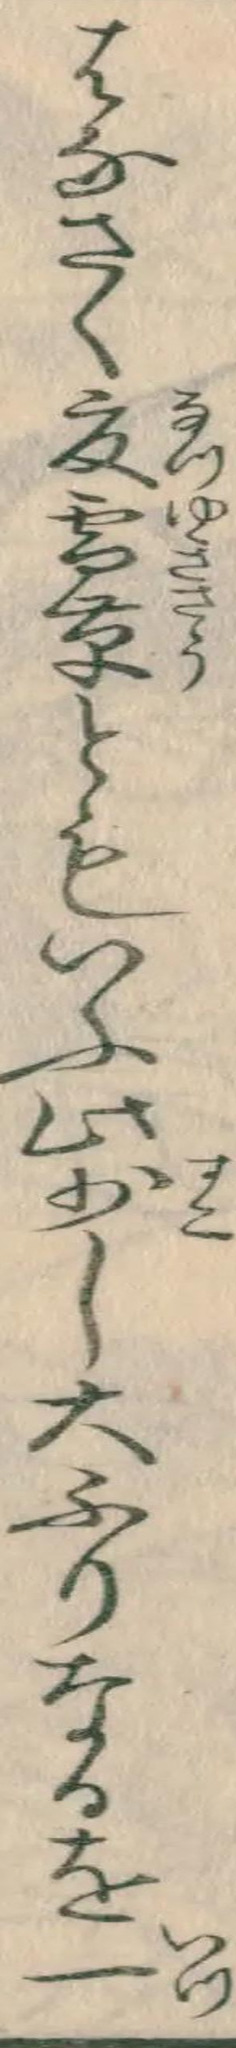はなさく夏雪草ともいふ此少し大ふりなるを一
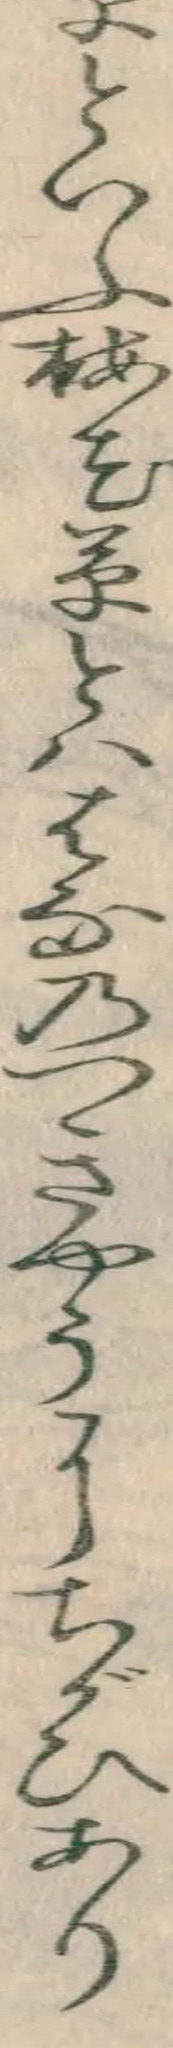花草といふ梅花草とははなのつきやうにちがひあり
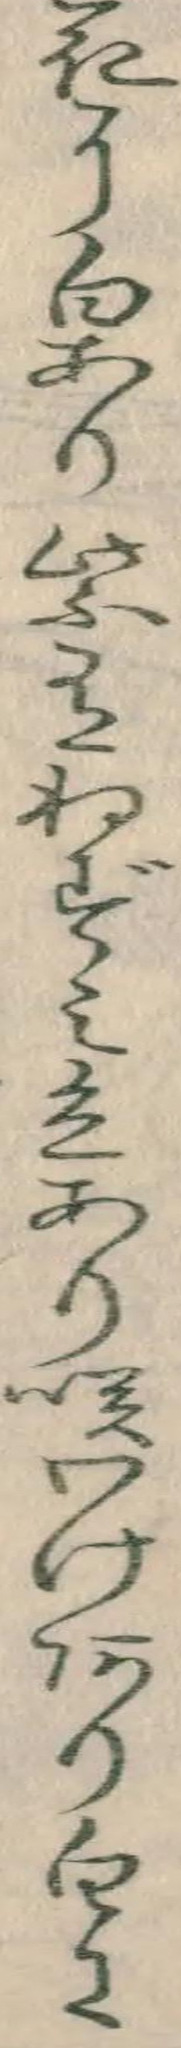花に白あり紫有ねずみ色あり咲わけあり白に
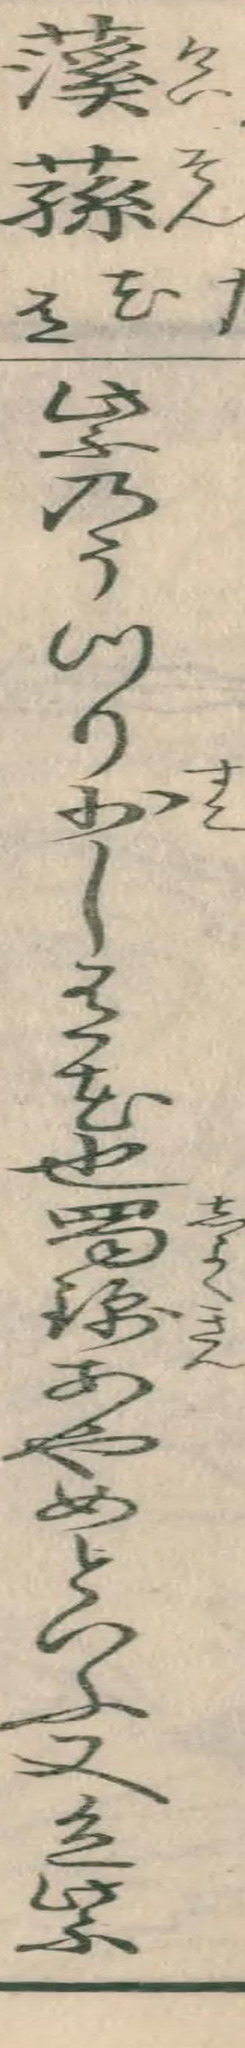紫のうつり少し有花也蜀錦あやめといふ又色紫
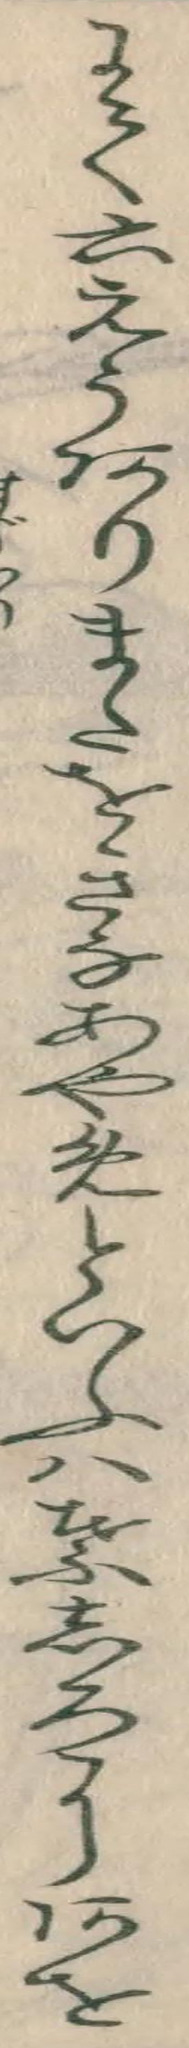にて六えうありまたをきなあやめといふは葉しろにあを
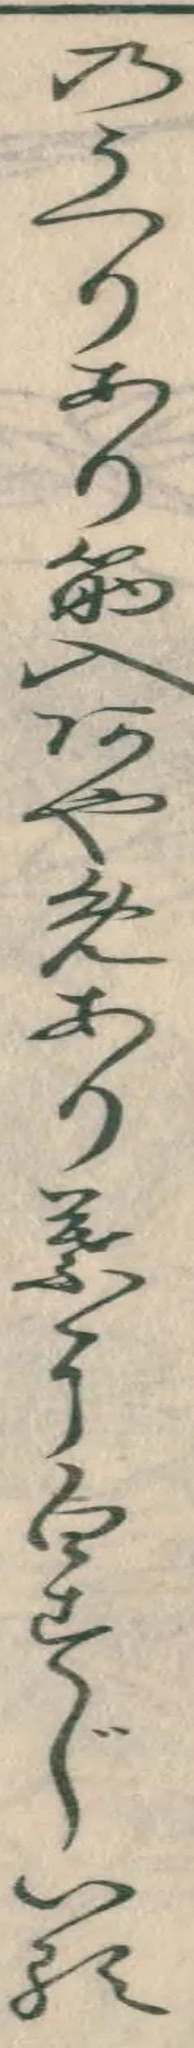のうつりあり筋入あやめあり葉に白すじいる
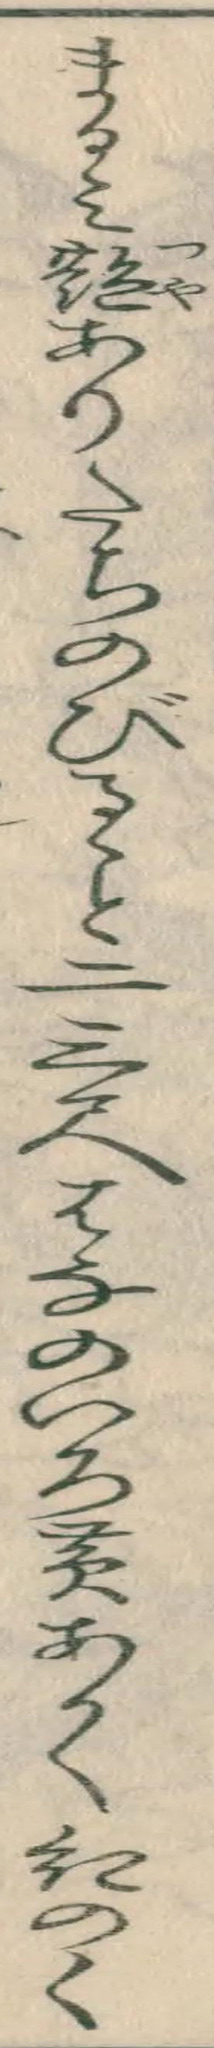まるみ艶ありたちのびること二三尺はなのいろ黄あかく紅のく
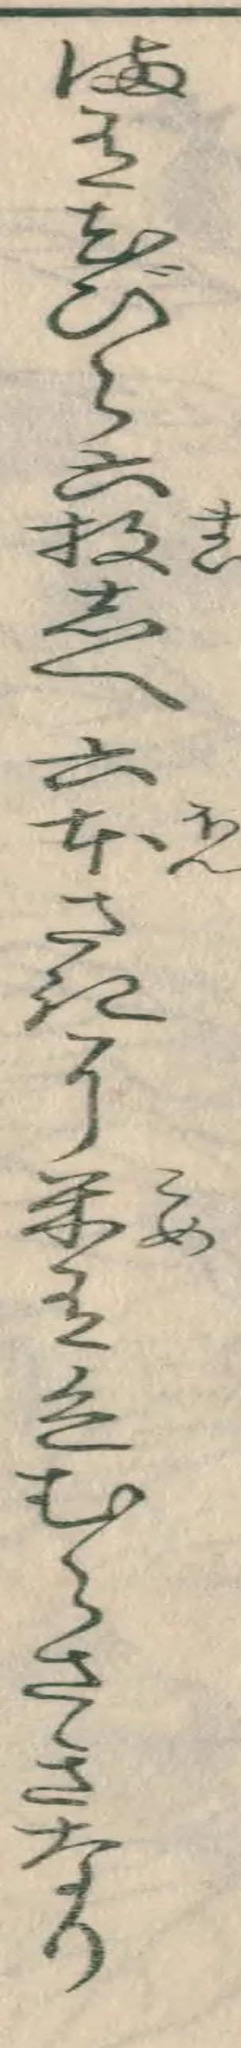ま有花びら六枚しへ六本さきに米有色むらさきなり

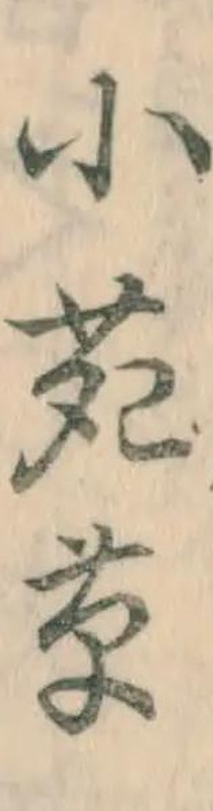小苑草
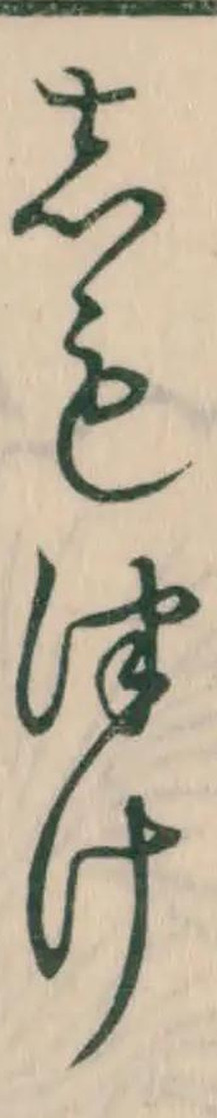しもつけ

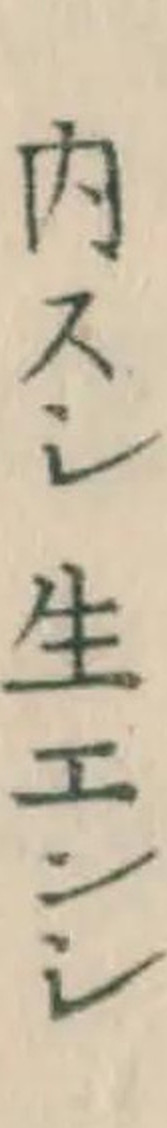内スシ生エンシ
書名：畫本野山草. [1]
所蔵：国立国会図書館 National Diet Library, JAPAN
